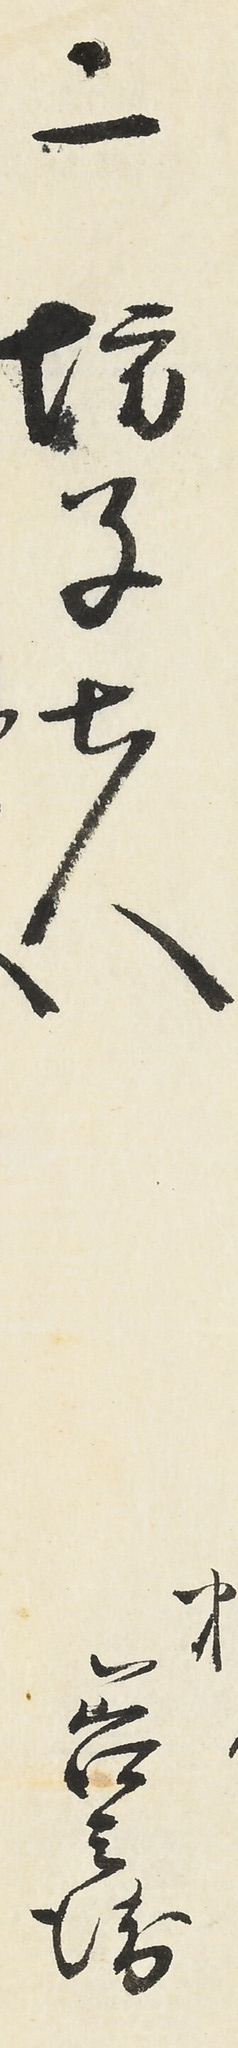・一坊子七人善兵衛
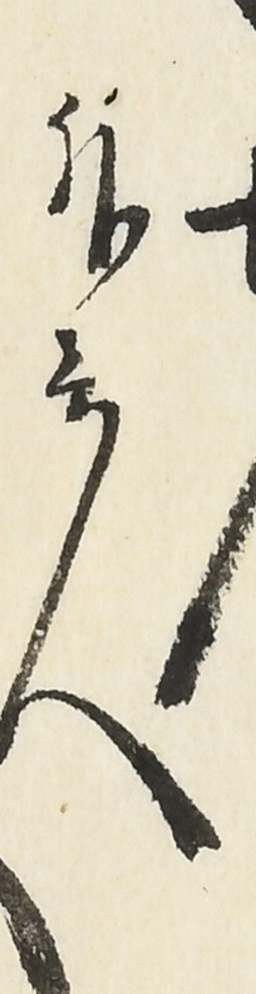外壱人
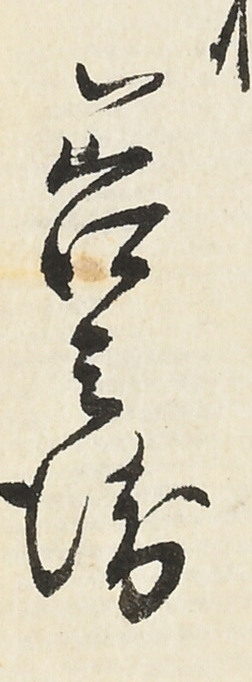利兵衛
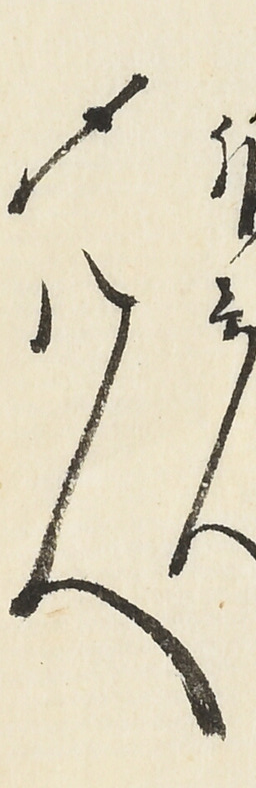〆八人
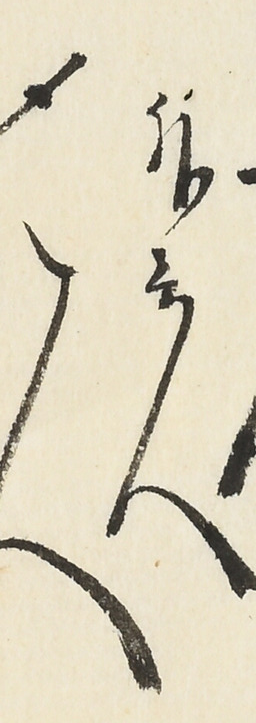外壱人
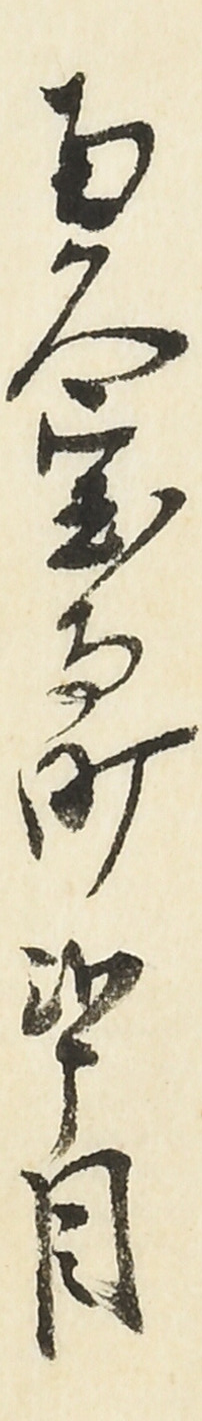南久宝寺町弐丁目
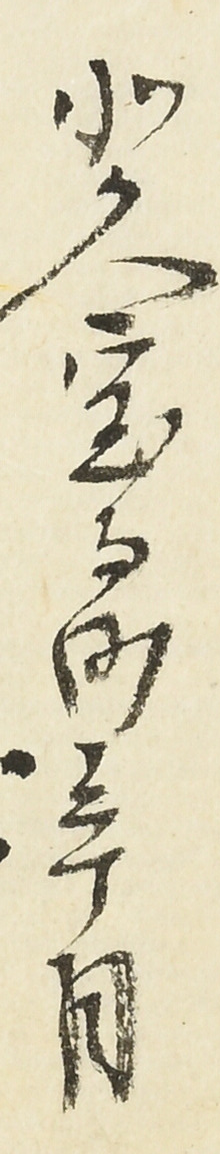北久宝寺町壱丁目
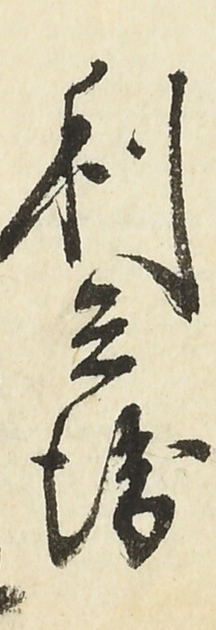利兵衛
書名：内藤大和守下宿割
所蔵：伊那市立高遠町図書館・合同会社AMANE
